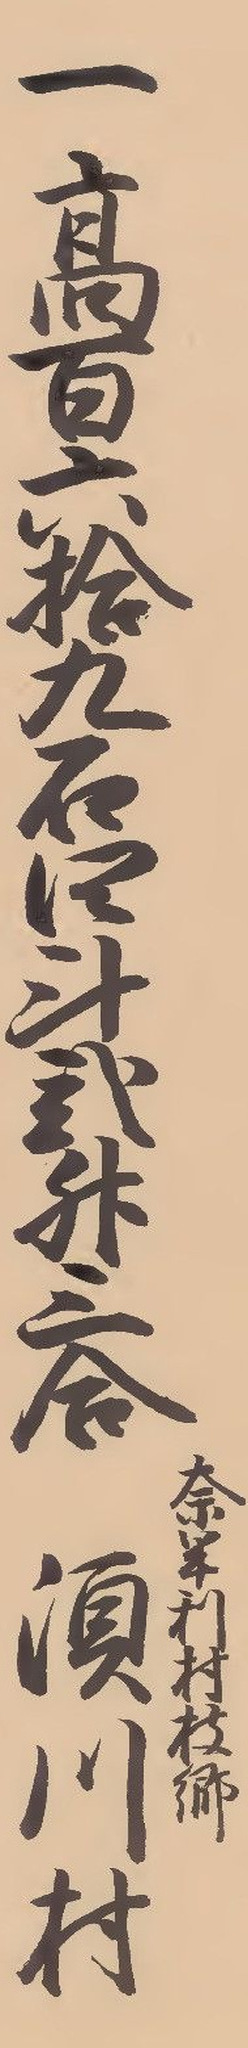一髙百六拾九石四斗弐升三合須川村
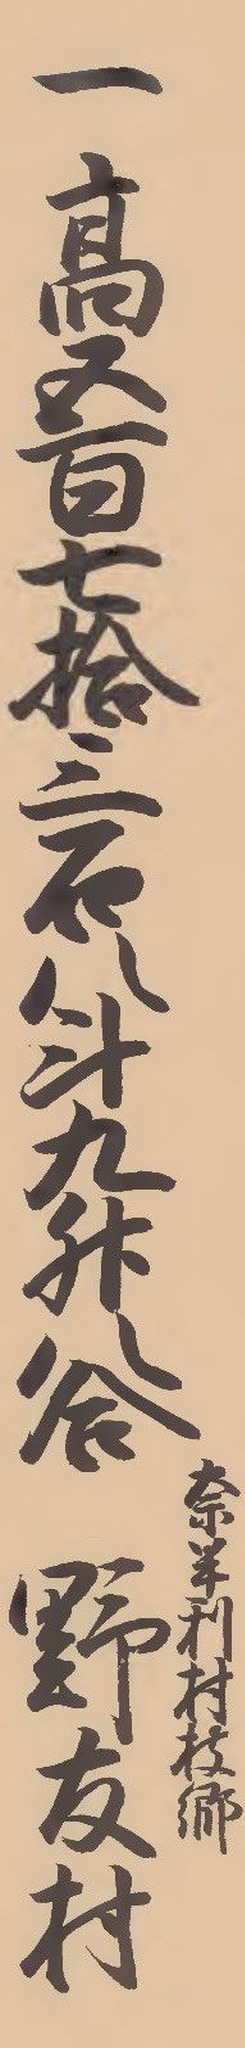一髙五百七拾三石八斗九升八合野友村
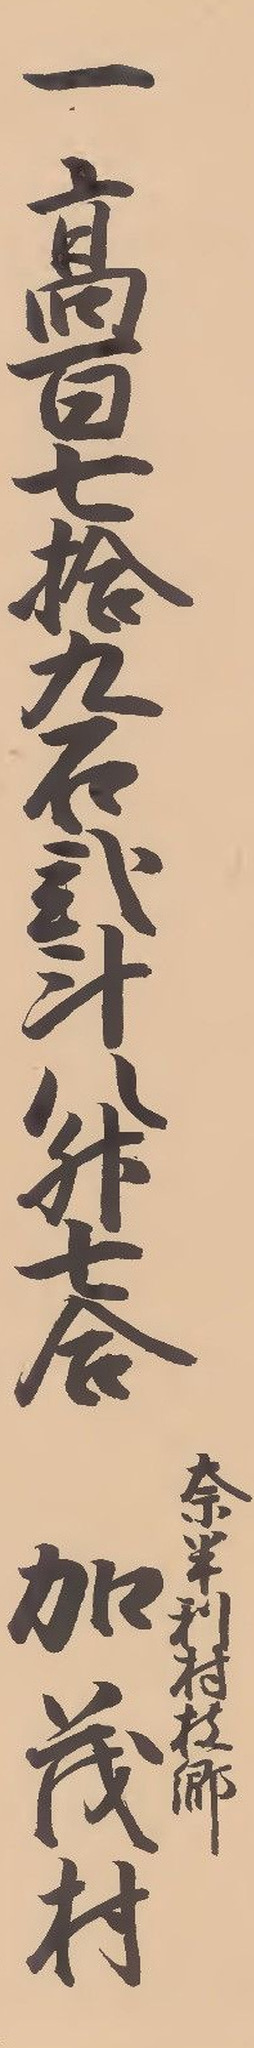一髙百七拾九石弐斗八升七合加茂村
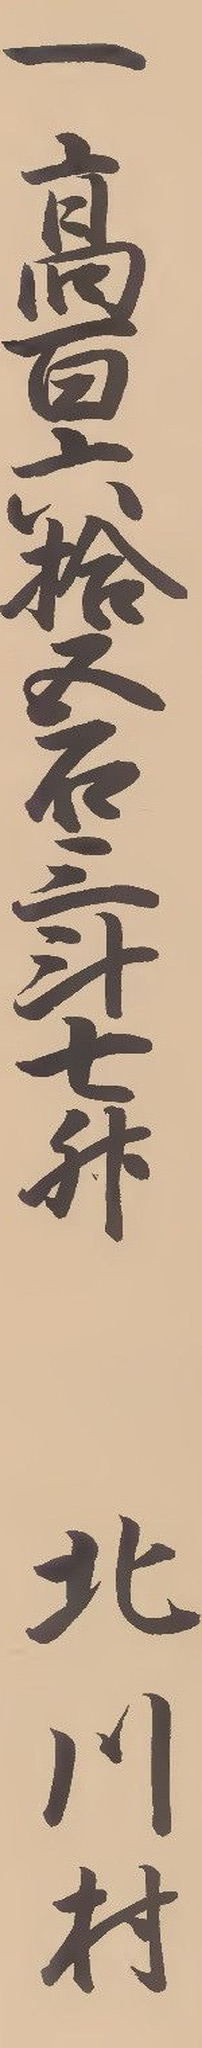一髙百六拾五石三斗七升北川村
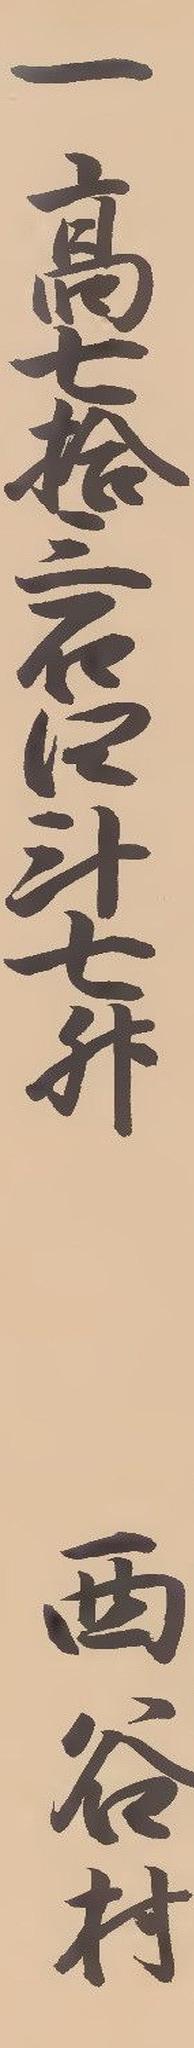一髙七拾三石四斗七升西谷村
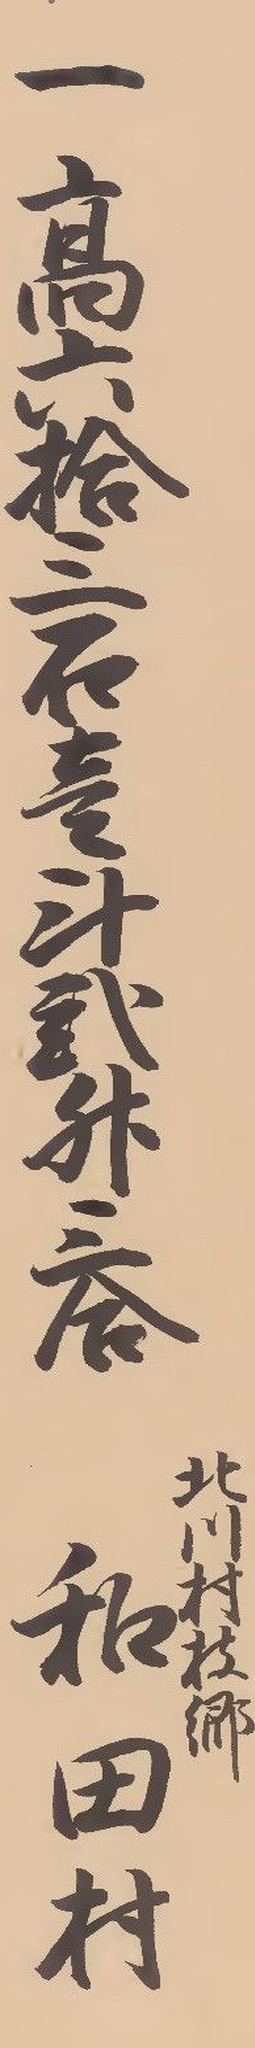一髙六拾三石壱斗弐升三合和田村
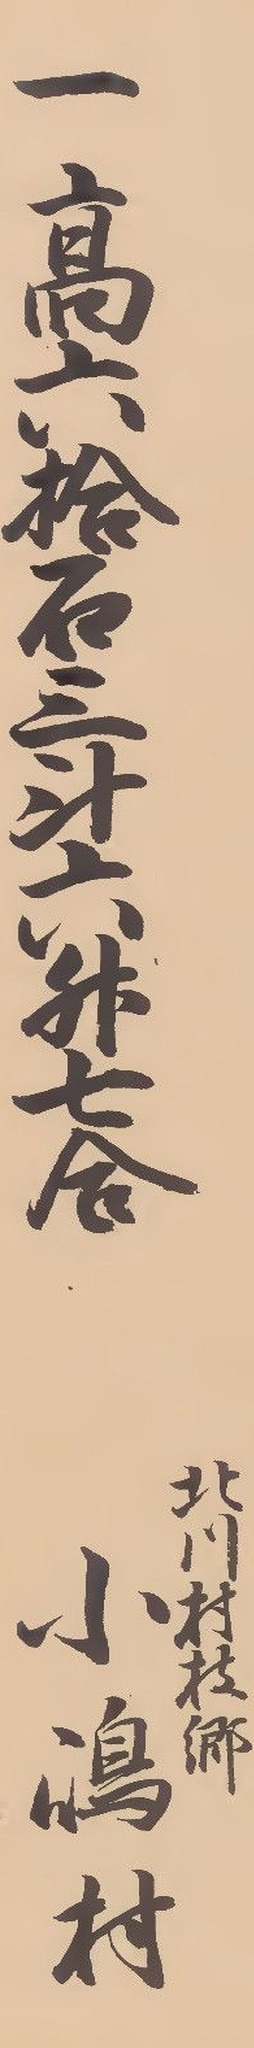一髙六拾石三斗六升七合小嶋村

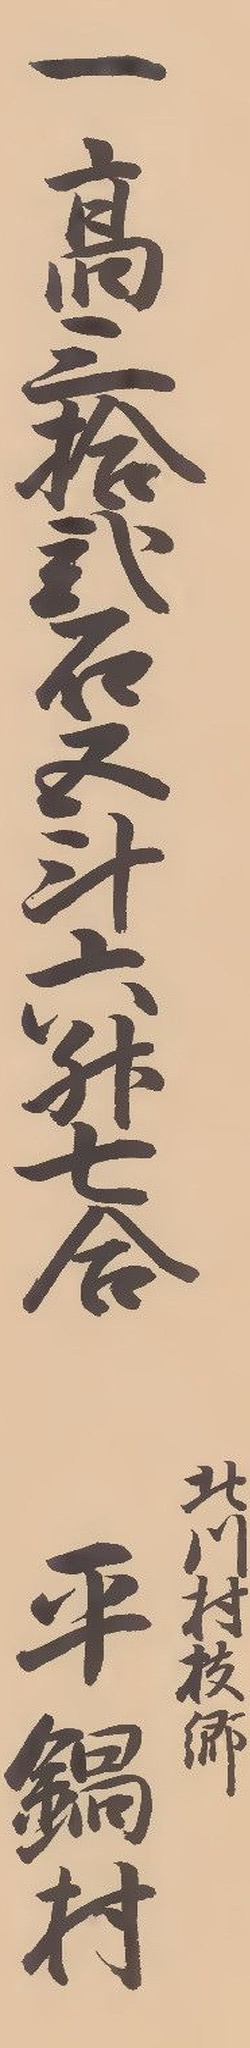一髙三拾弐石五斗六升七合平鍋村
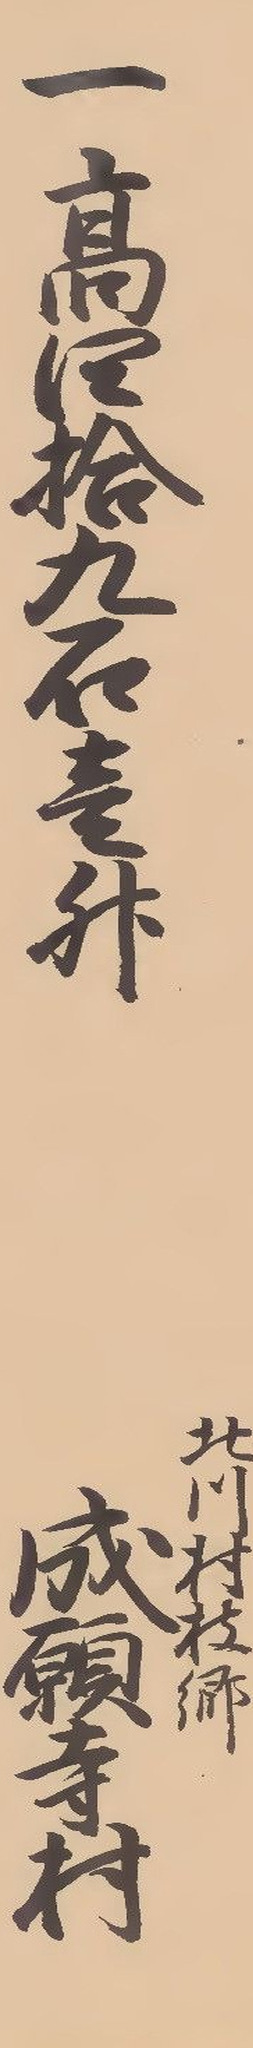一髙四拾九石壱升成願寺村
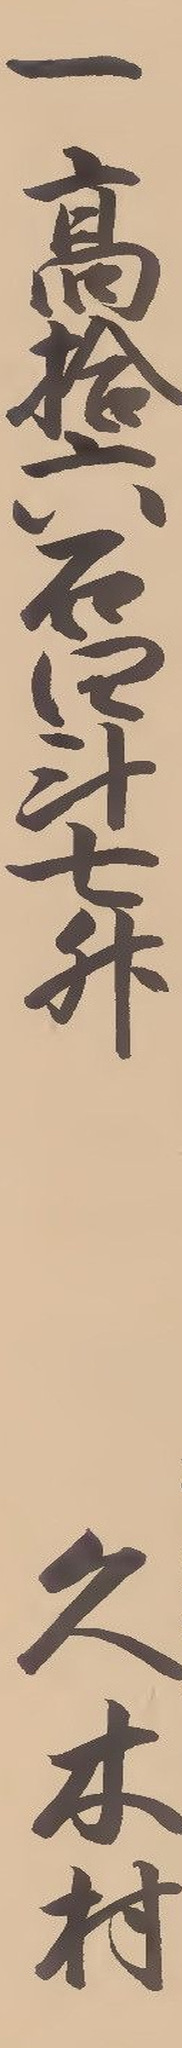一髙拾六石四斗七升久木村
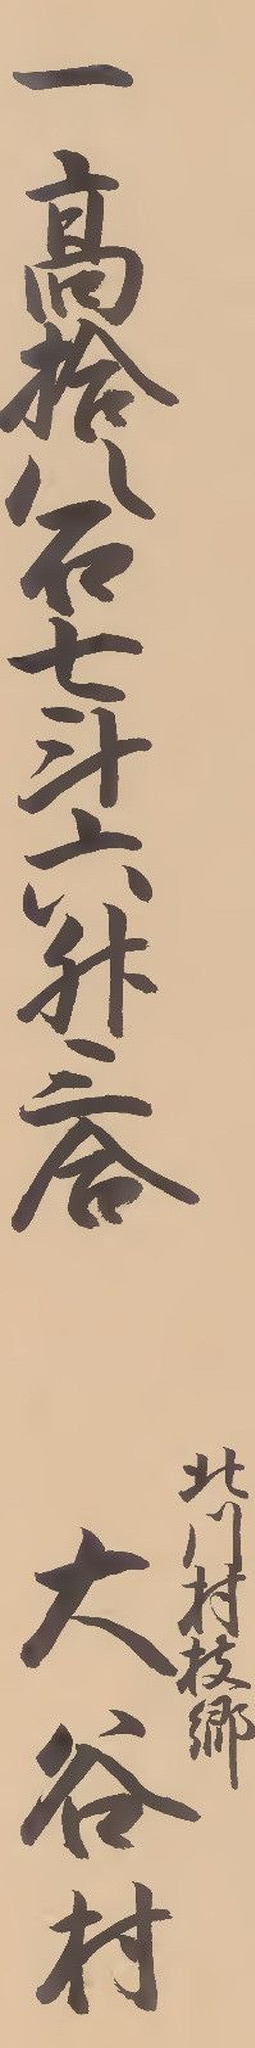一髙拾八石七斗六升三合大谷村
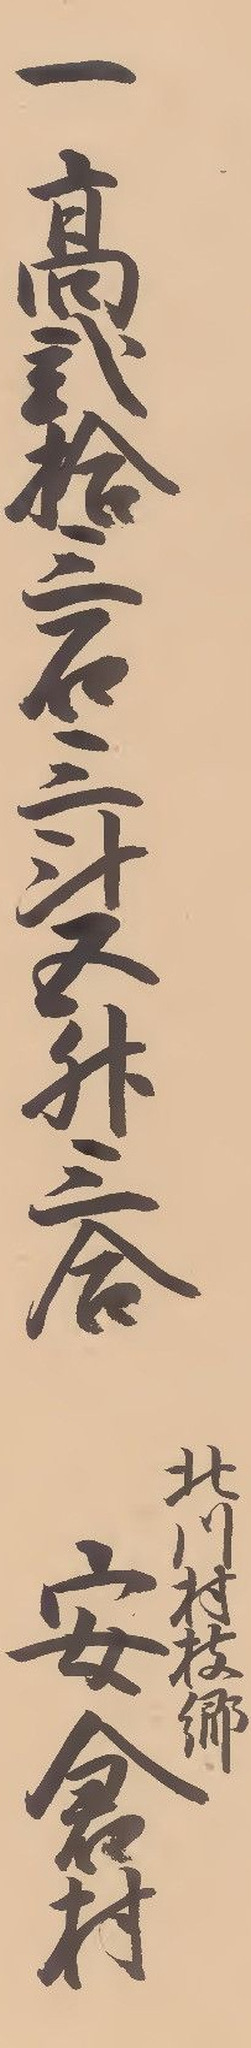一髙弐拾三石三斗五升三合安倉村

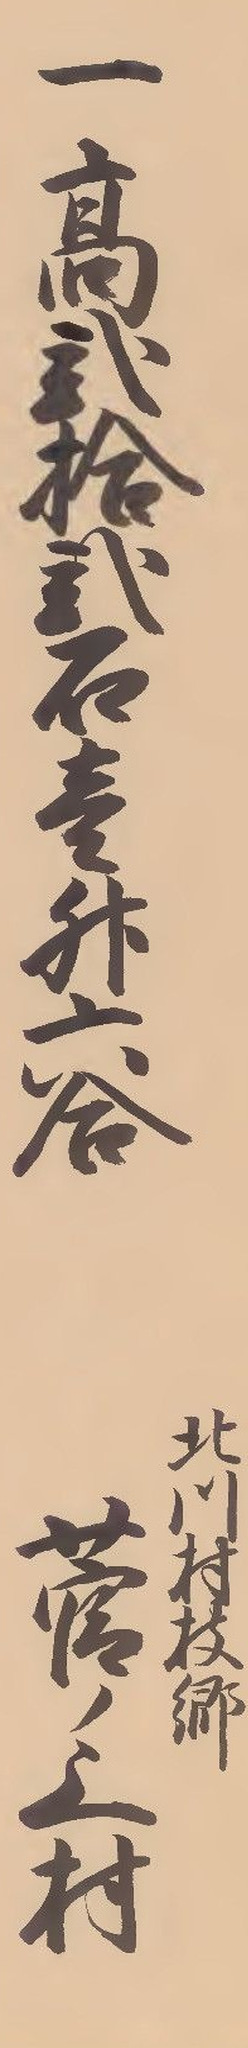一髙弐拾弐石壱升六合菅ノ上村
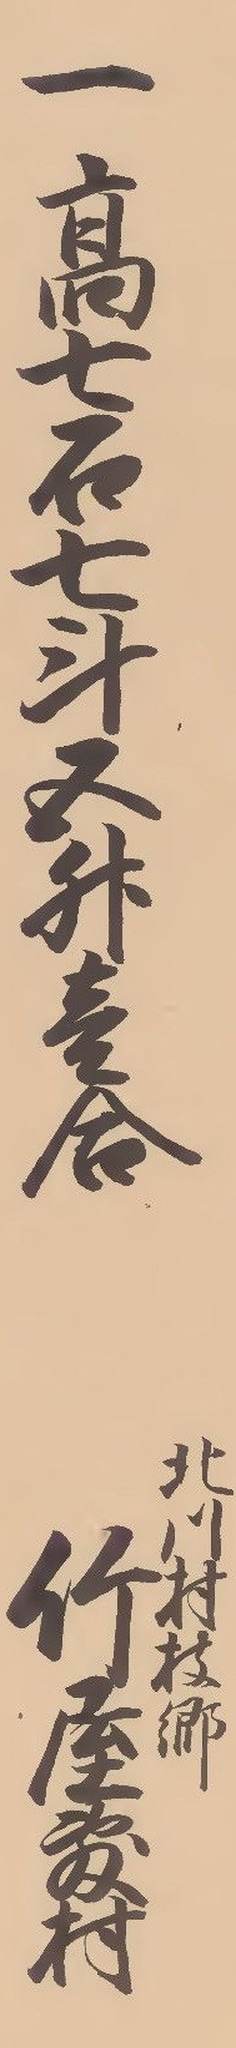一髙七石七斗五升壱合竹屋敷村
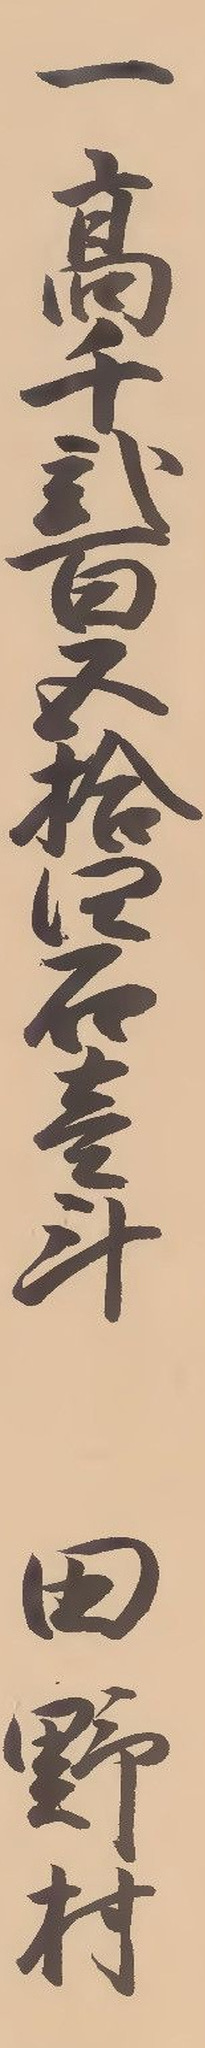一髙千弐百五拾四石壱斗田野村
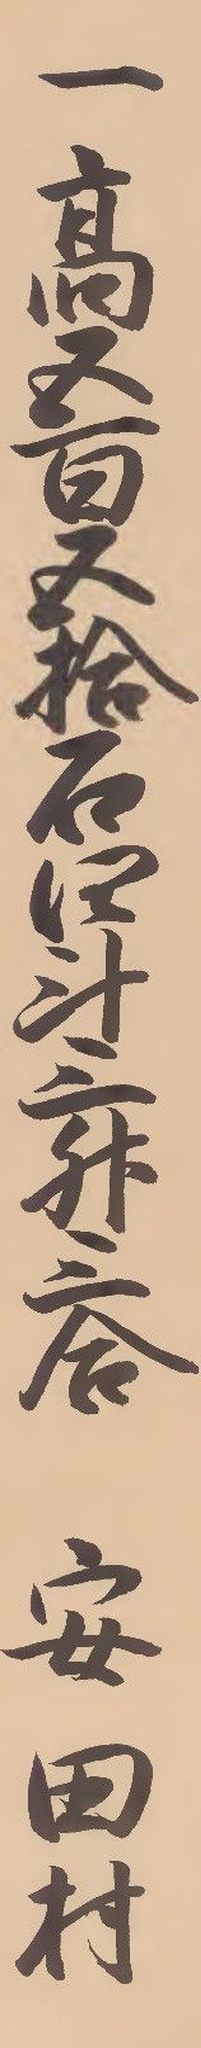一髙五百五拾石四斗三升三合安田村
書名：土佐国郷帳
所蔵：国立公文書館 National Archives of Japan
